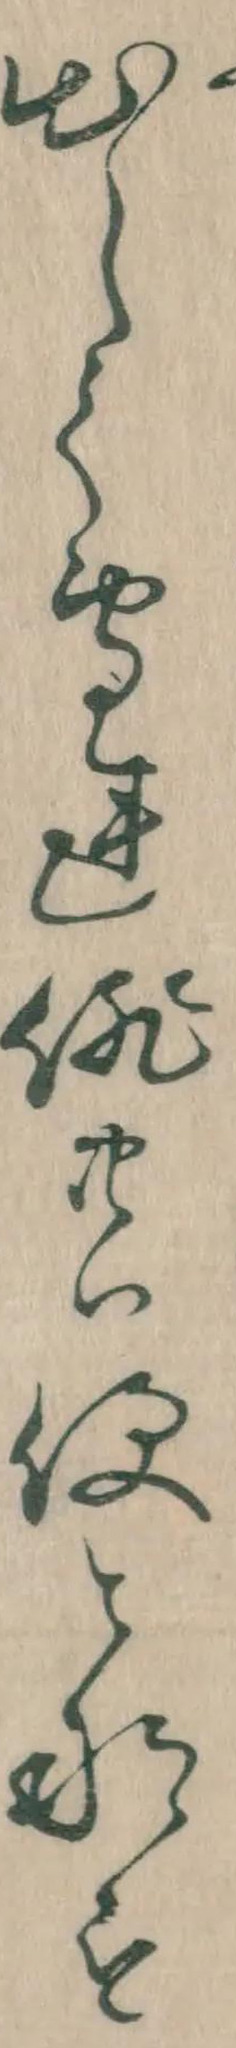出して専連俳の便となす
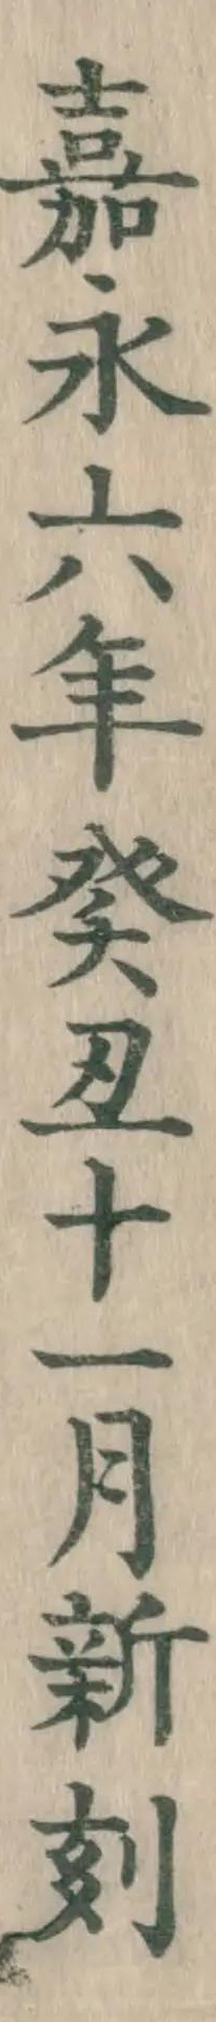嘉永六年癸丑十一月新刻
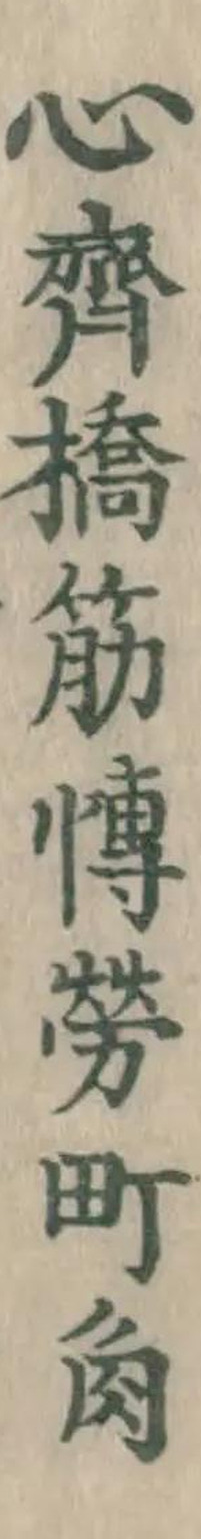心斎橋筋博労町角
